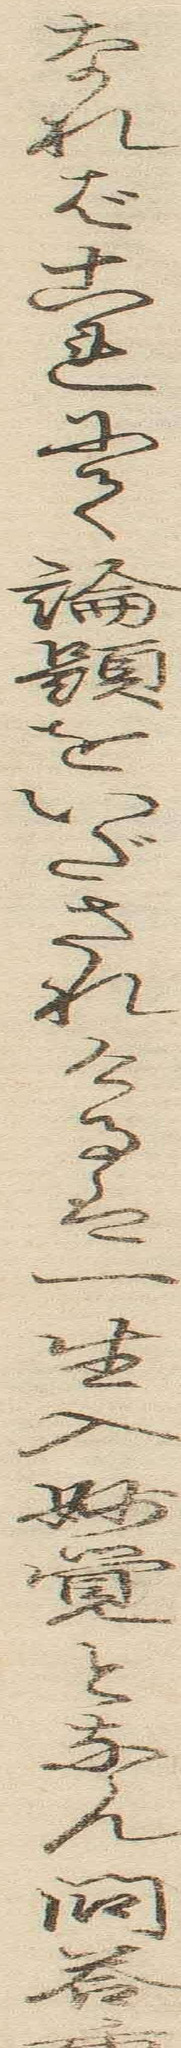なればこれにて論題をいだされけるは一生入妙覚となん問荅重

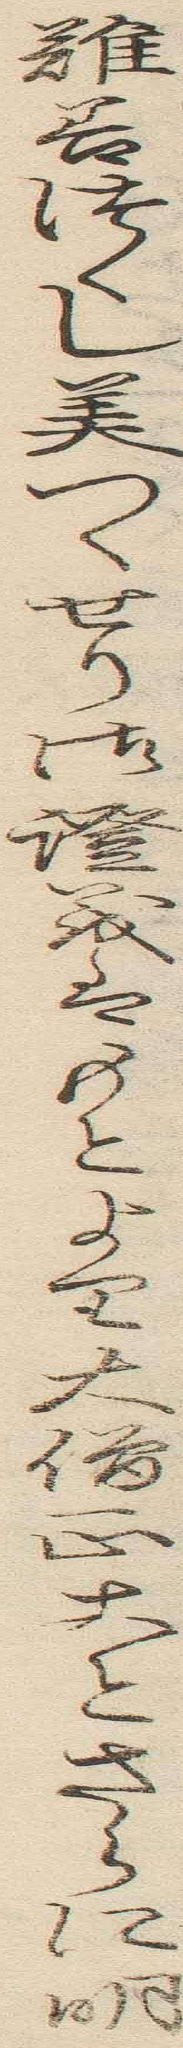難善つくし美つくせり御證義はもとより大僧正ことさらに明智
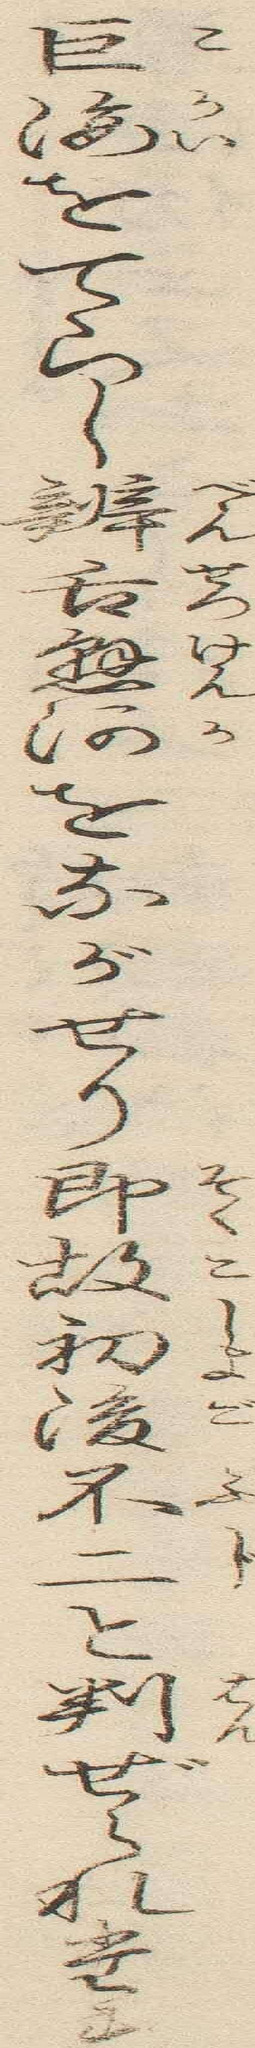巨海をてらし辨舌懸河をながせり即故初後不二と判ぜられたれ
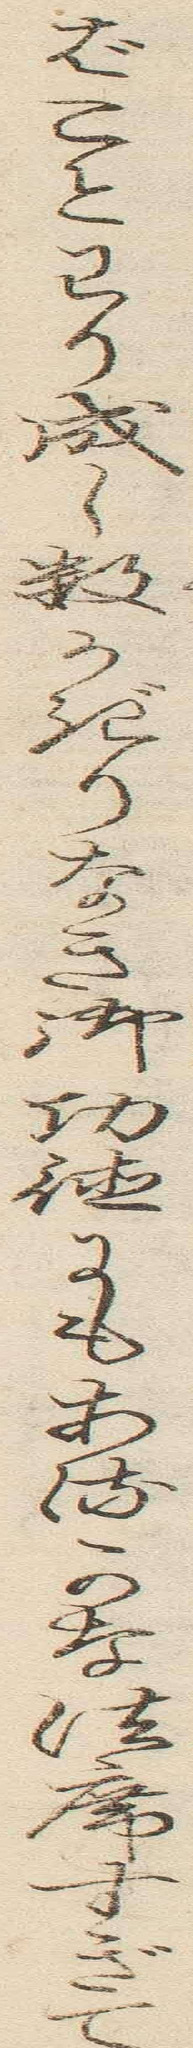ばことわり成し数かぎりなき御功徳にもあるかな法席すぎて
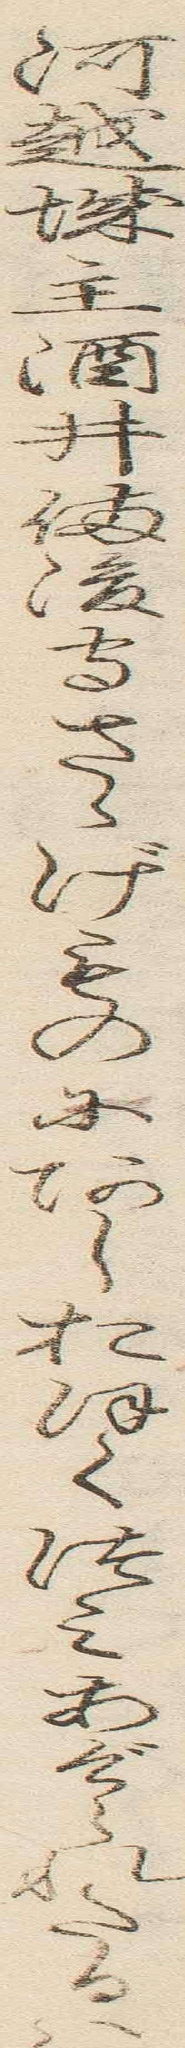河越城主酒井備後神さゝげものにあしおほくつみあげられたるは
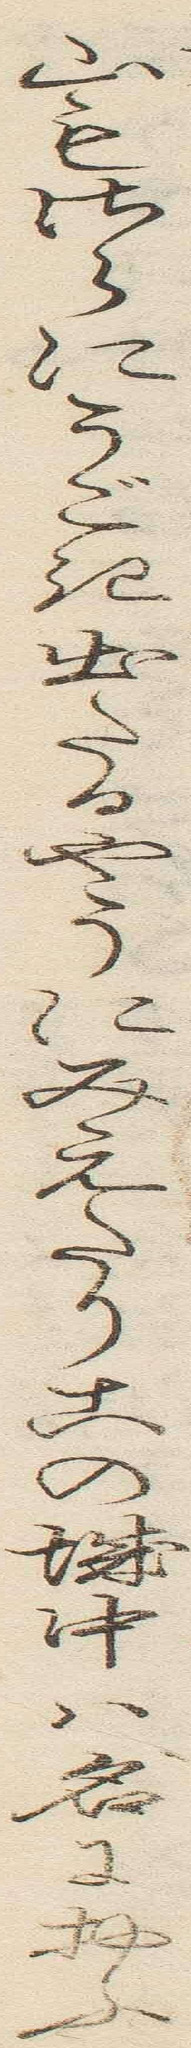山もさらにうごき出たるやうにみえたりこの城中は名におふ
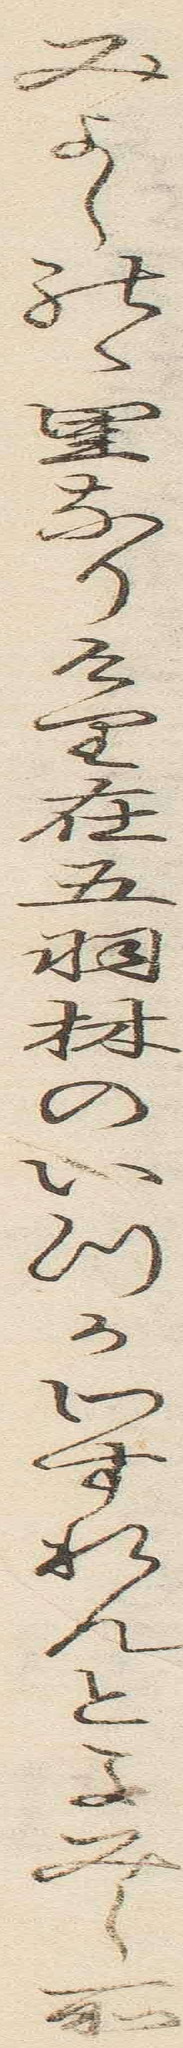みよしのゝ里なりけり在五羽林のいつかわすれんとよみし所
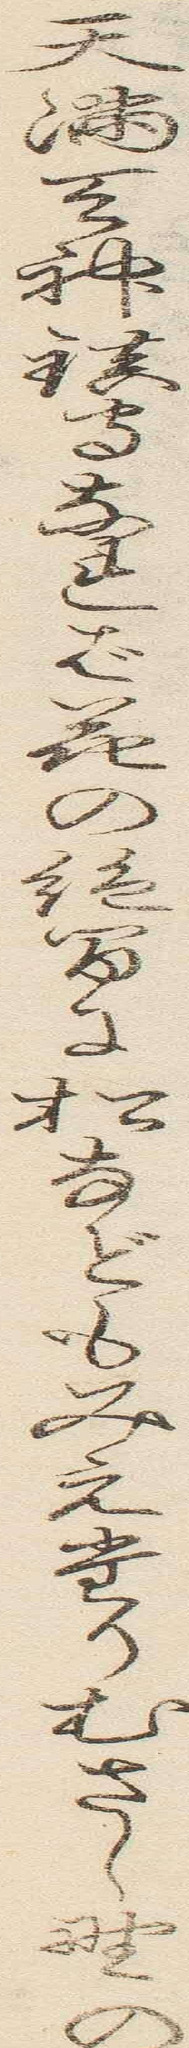天満天神鎮守なれば花の絶間に松などもみえたりむさし㙒の
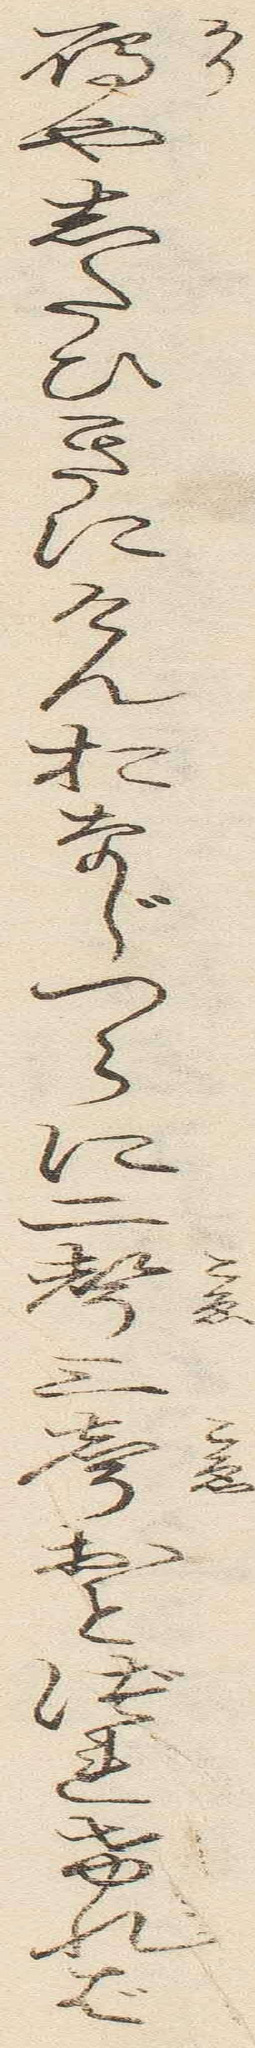鴈やしたひきにけんおなじつらに二聲三聲おとづれければ
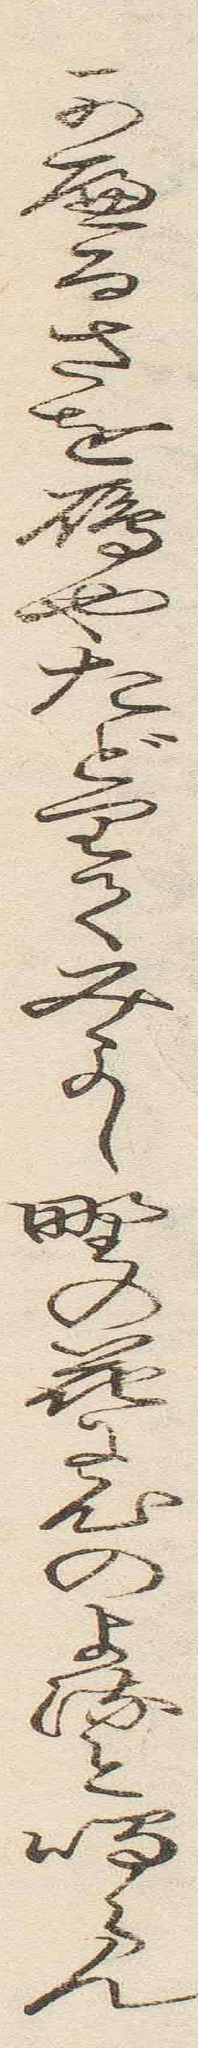かへるさを鴈やたどりてみよし㙒の花に心のよると鳴らん
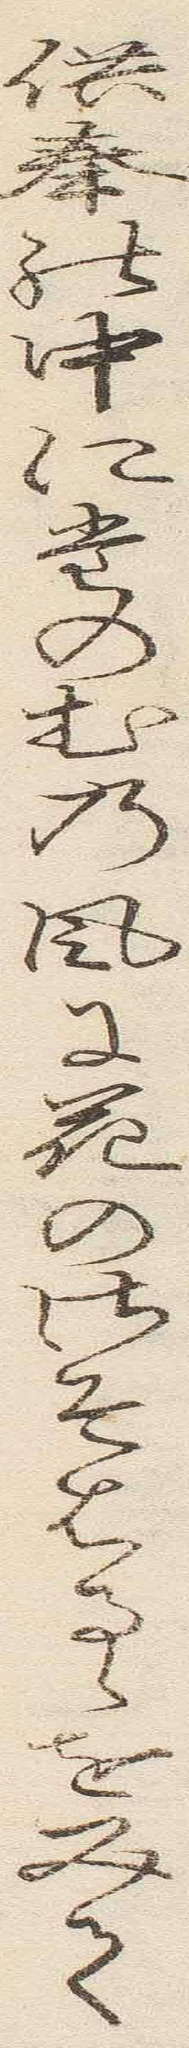供奉の中にたのむの風に花のさそはるゝをみて
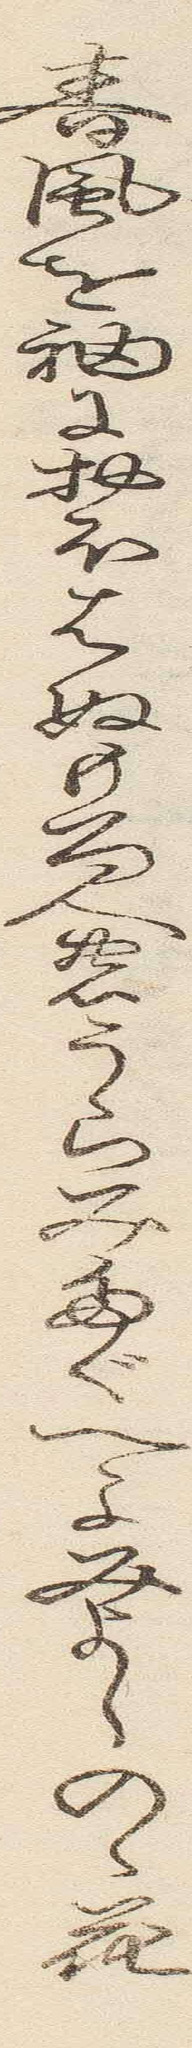春風を袖におほはぬもろ人のうらみたぐへよみよしのゝ花
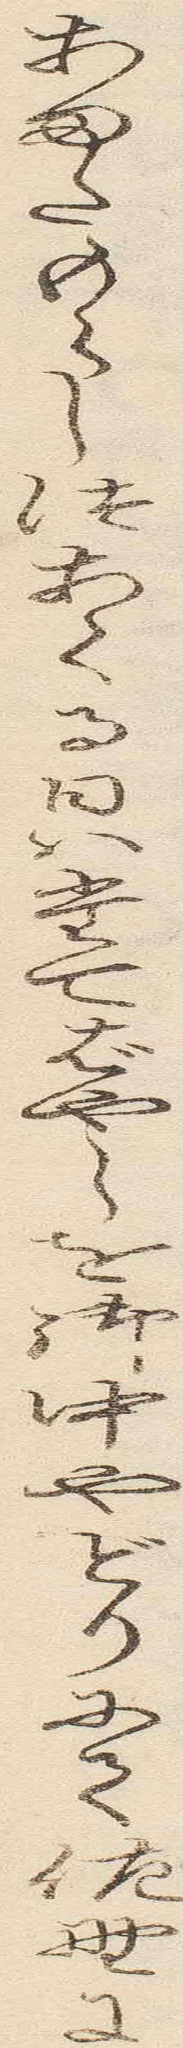あまたもらしつあくる日はたてばやしを御中やどりにて佐㙒に
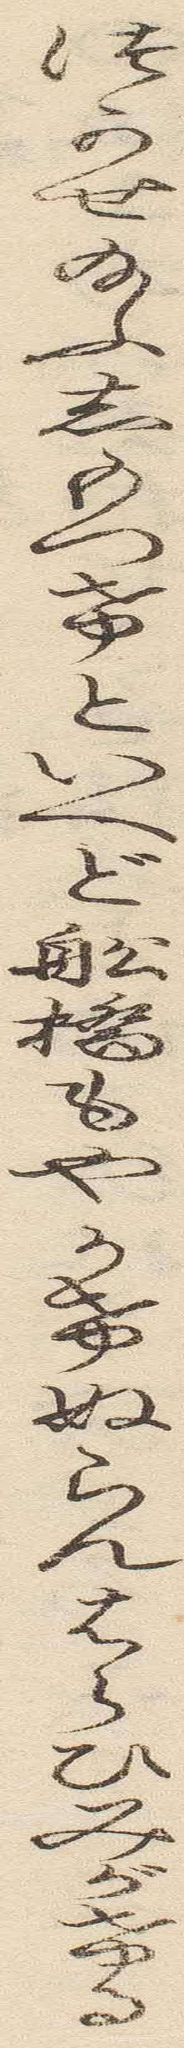つかせ給ふしもつけといへど舩橋もやかけぬらんはらひみがける
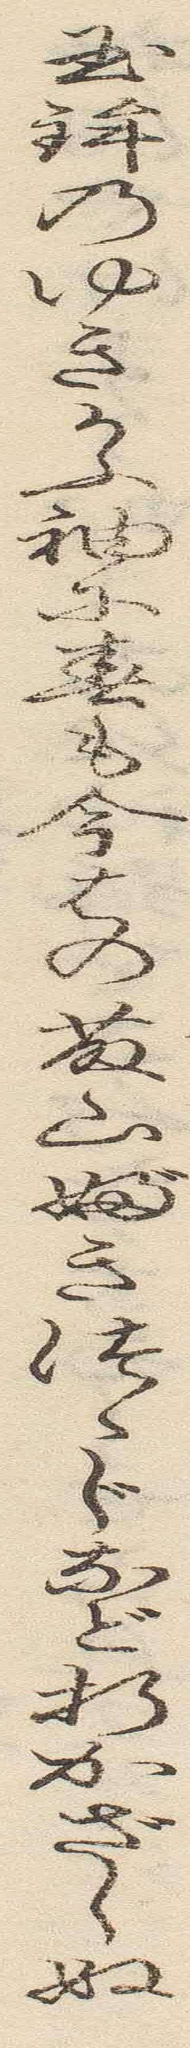玉鉾のゆきかふ袖に春も今はの藤山ぶきつゝじなど折かざしぬ
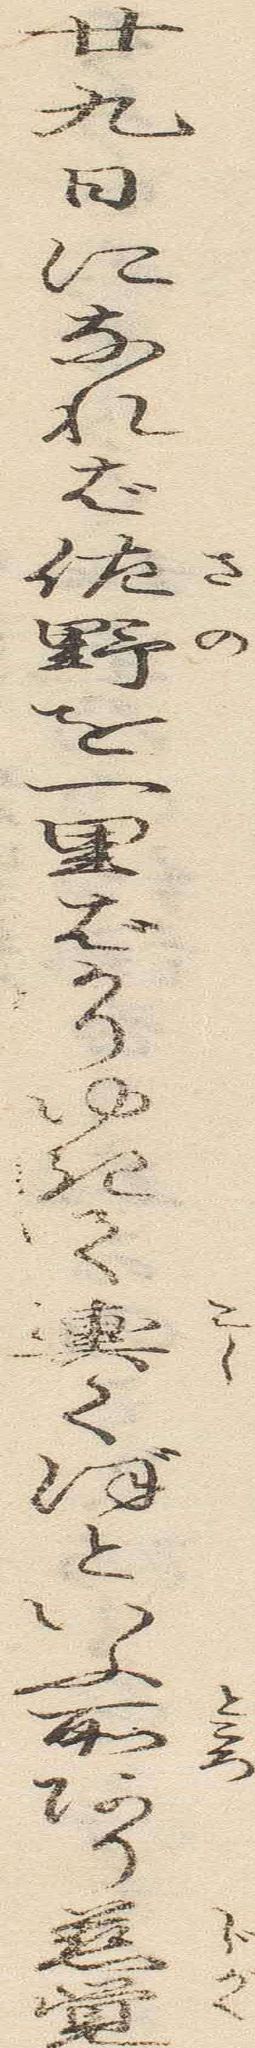廿九日になれば佐野を一里ばかりゆきて輿くぼといふ所なり慈覚
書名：日光山志
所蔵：東京学芸大学附属図書館 国文学研究資料館
